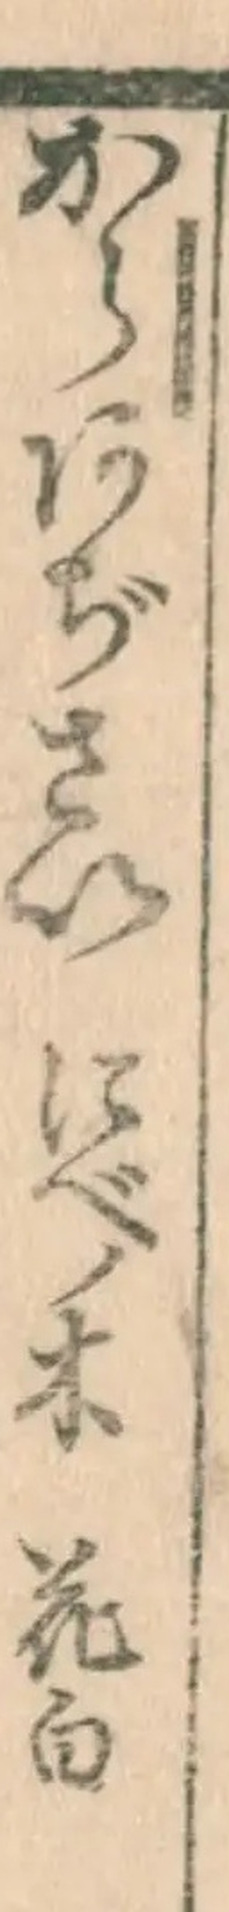からあぢさいにべの木花白
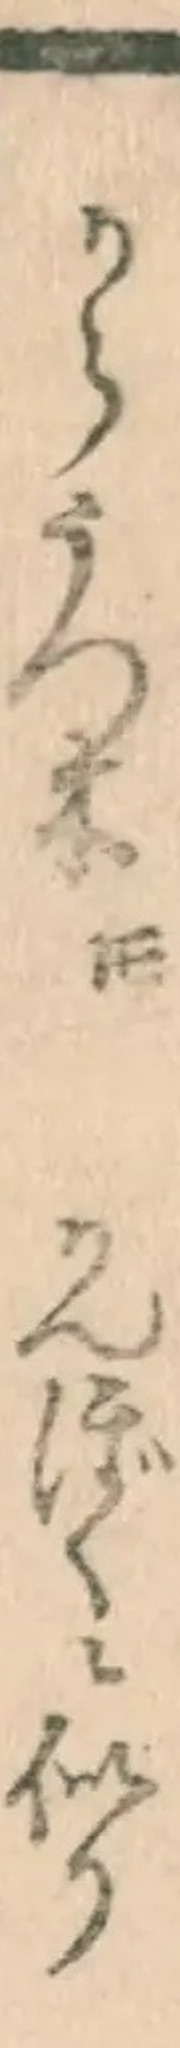からうつ木共かんぼくに似り
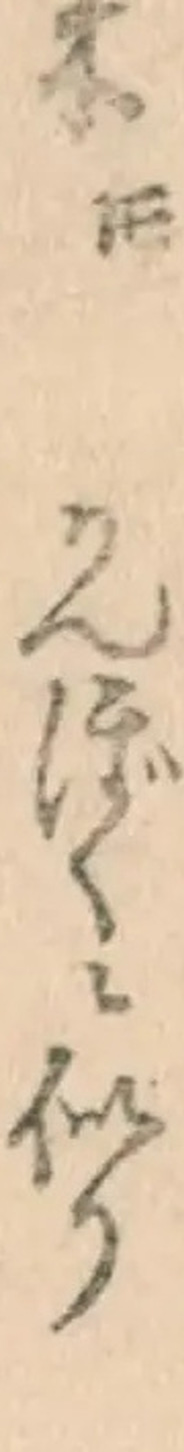たんどくに似り
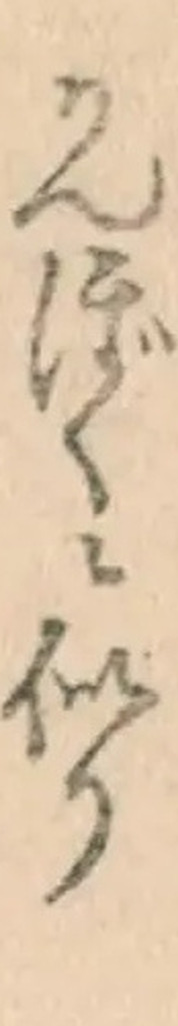たんどくに似り
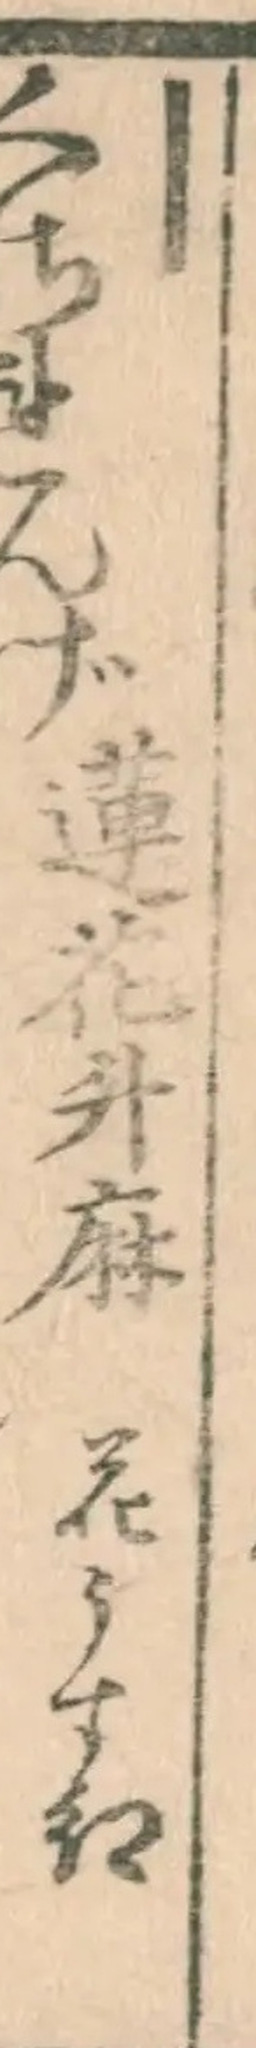くされんげ蓮花升麻花うす紅
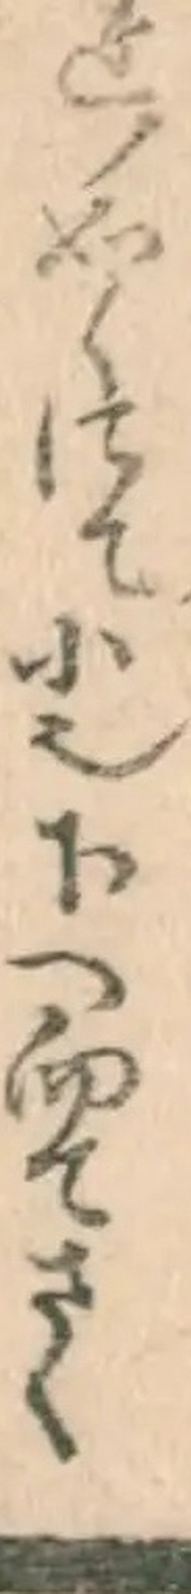蓮のやくにて小也下へ向てさく
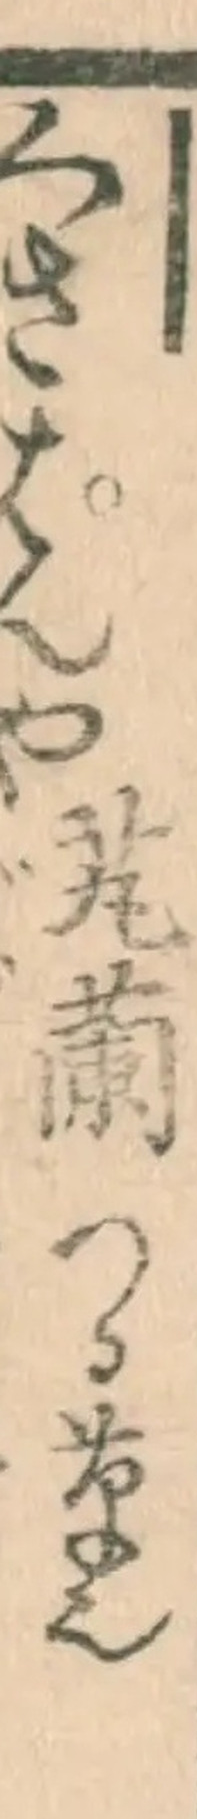くさはんや芄蘭つるの也
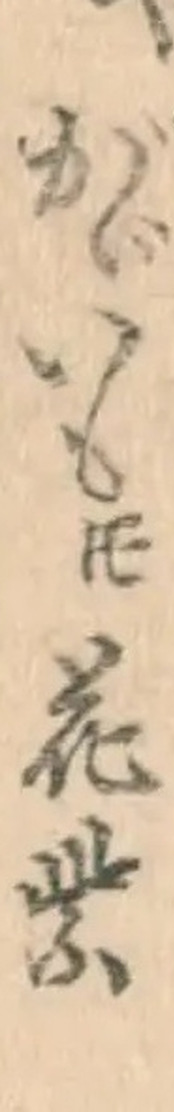がゞいも共花紫
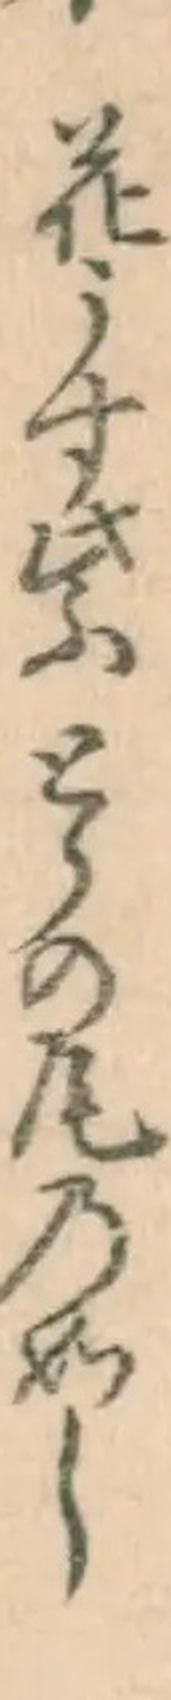花うす紫とらの尾の如し
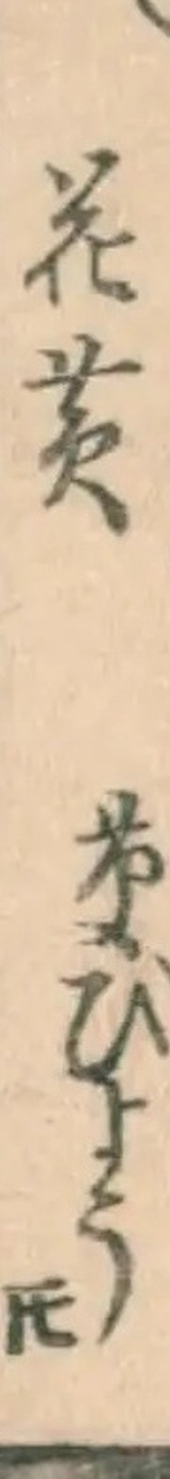花黄草びよう
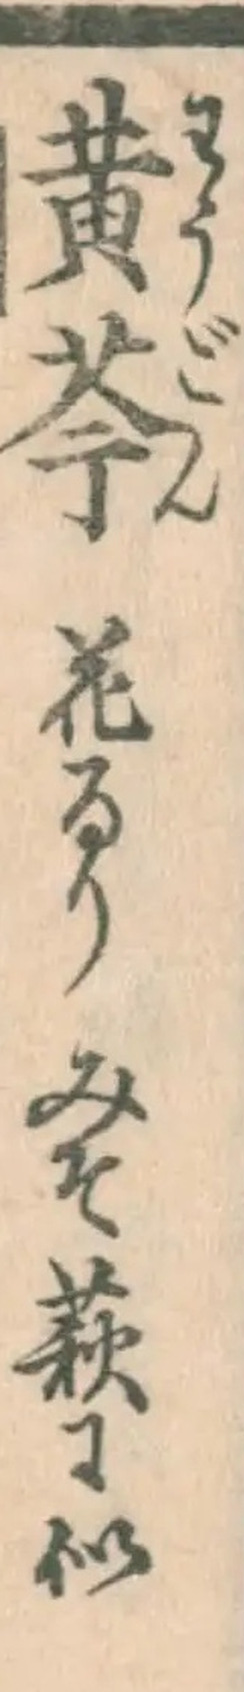黄芩花るりみそ萩に似
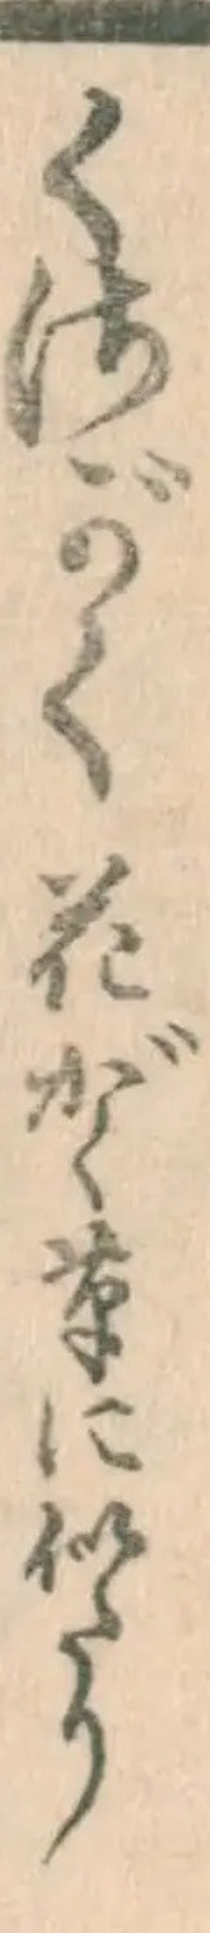くさがく花がく草にに似たり
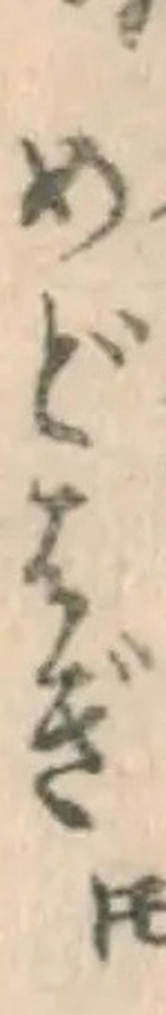めどはぎ共
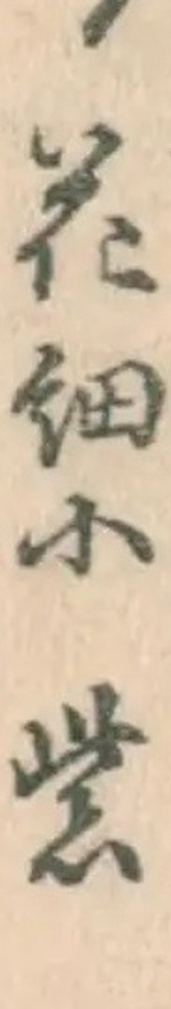花細小紫
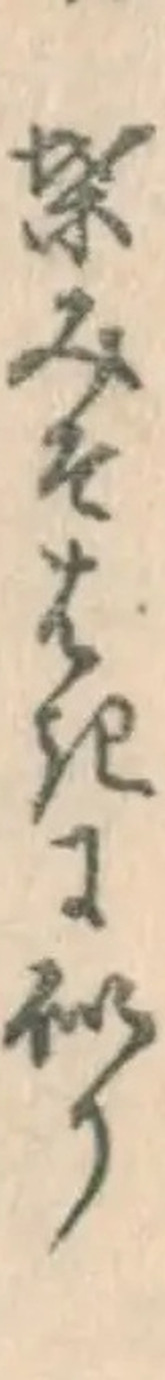葉みそはきに似り
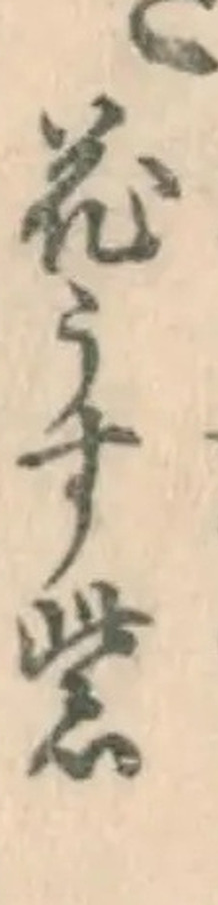花うす紫
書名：茶席挿花集
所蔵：国立国会図書館 National Diet Library, JAPAN
